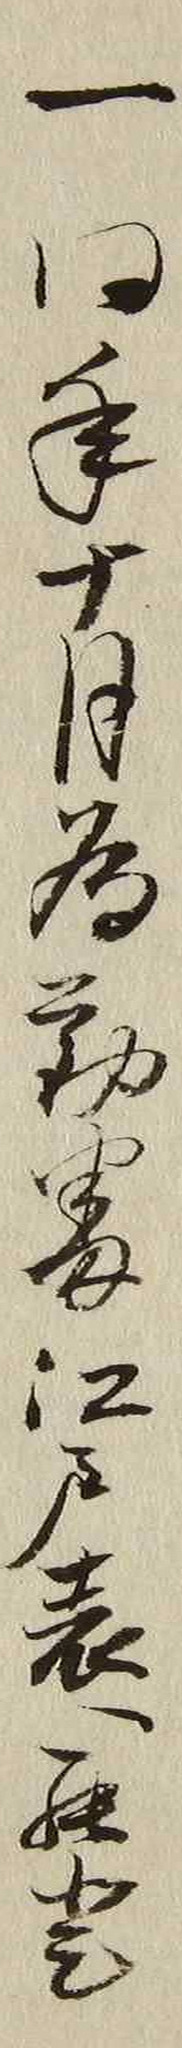一同年十月為勤番江戸表へ罷登
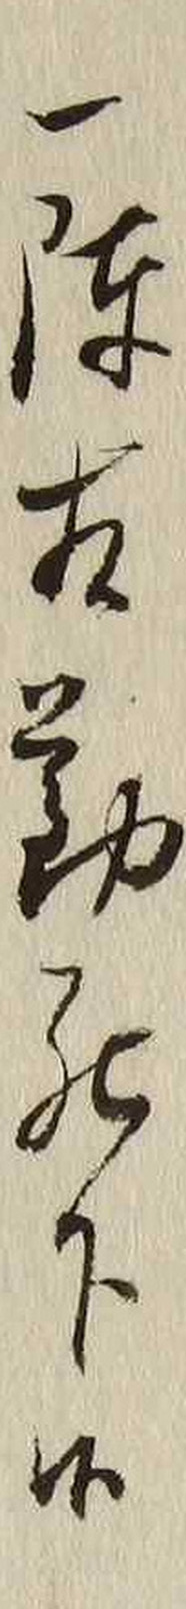一陣相勤罷下候
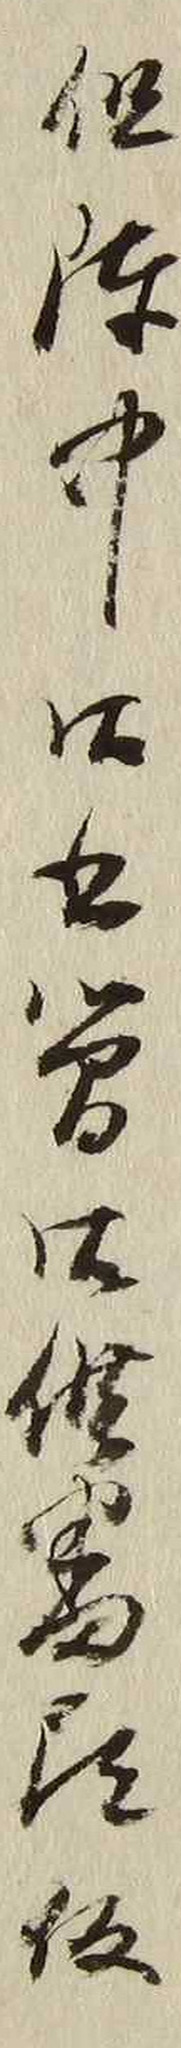但陣中御書簡御供番頭仮
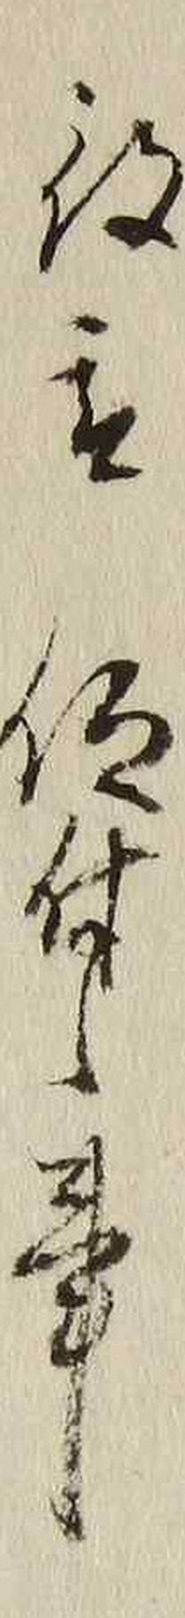被仰付候事
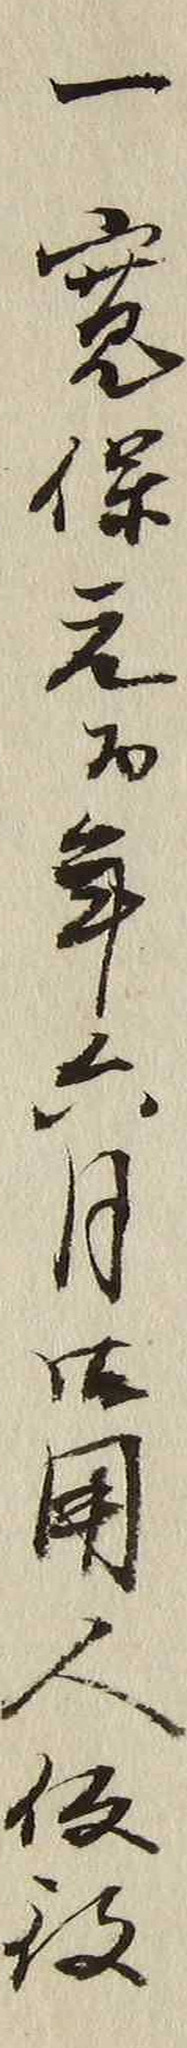一寛保元酉年六月御用人仮役
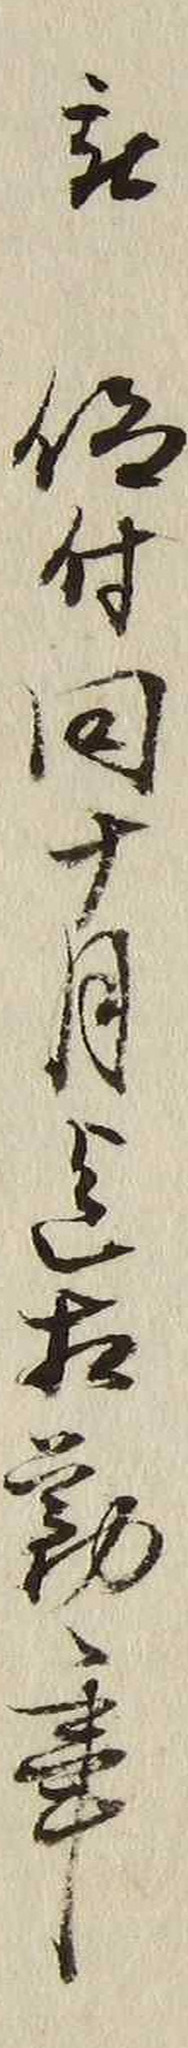被仰付同十月迄相勤候事
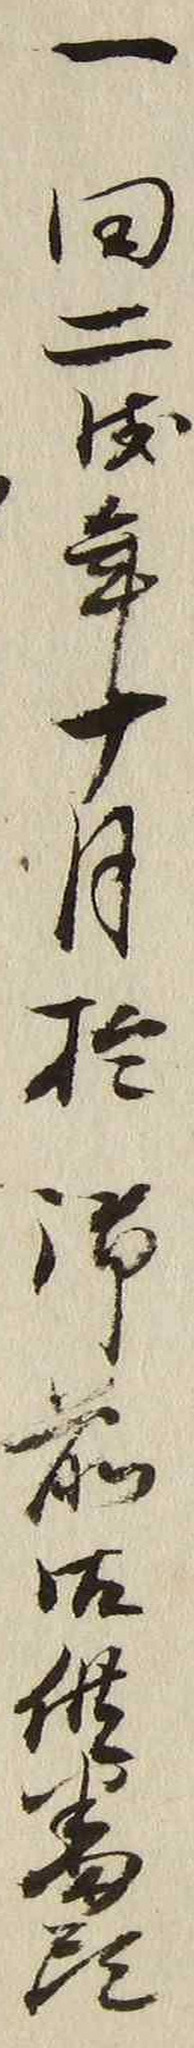一同二戌年十月於御前御供番頭
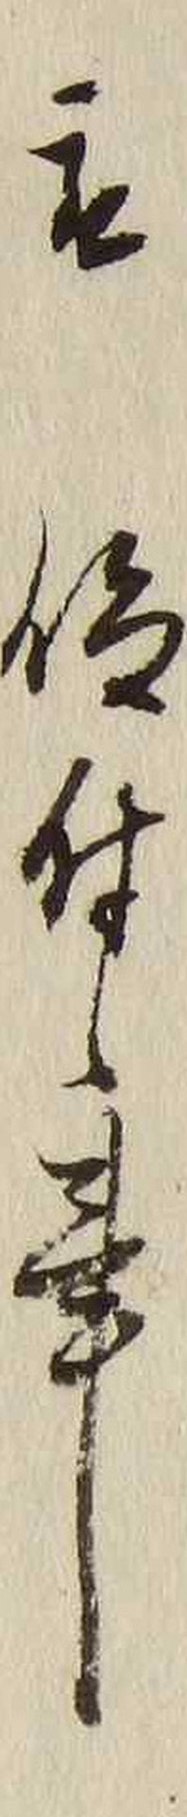被仰付候事
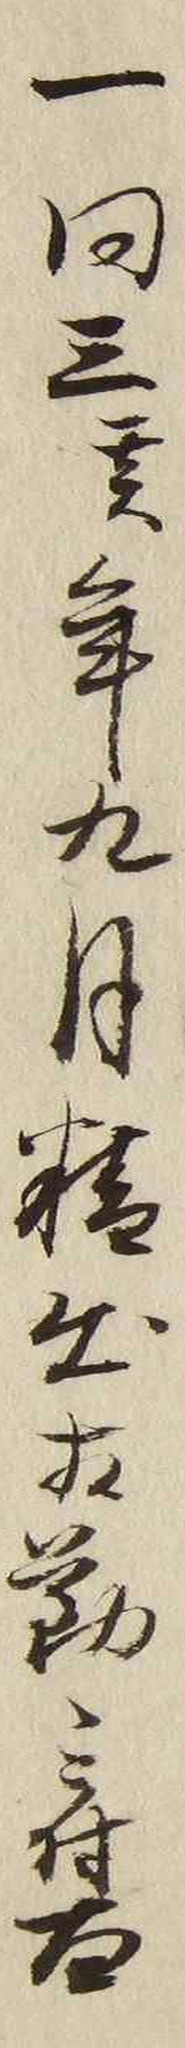一同三亥年九月精出相勤候ニ付百

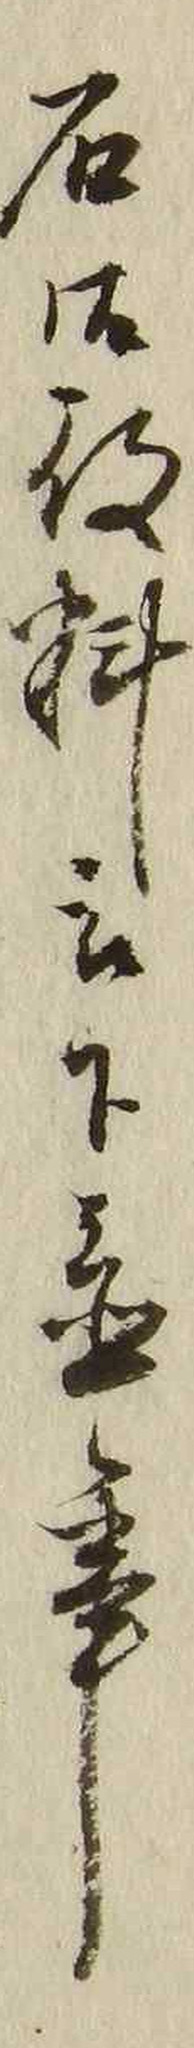石御役料被下置候事
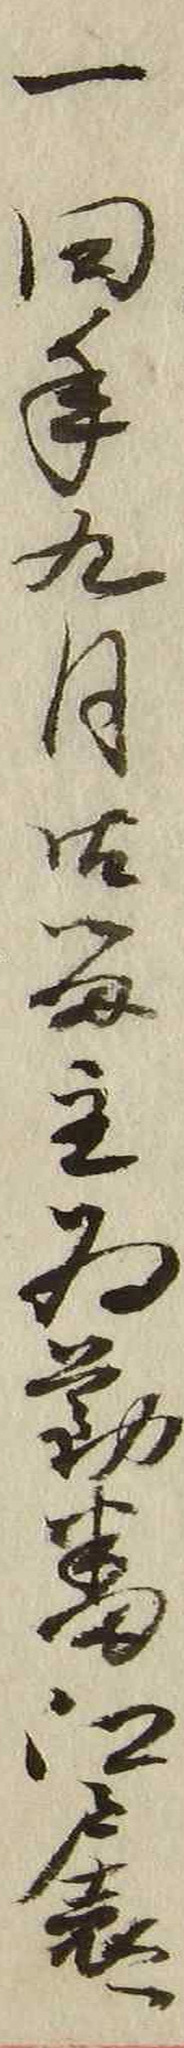一同年九月御留主為勤番江戸表へ
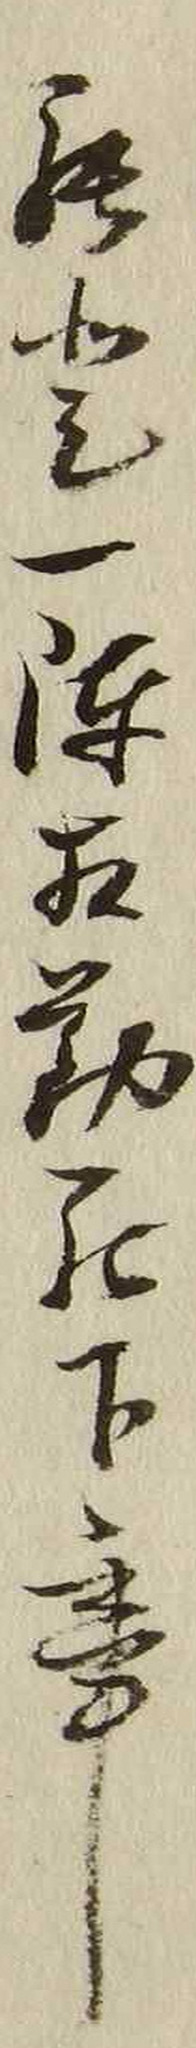罷登一陣相勤罷下候事
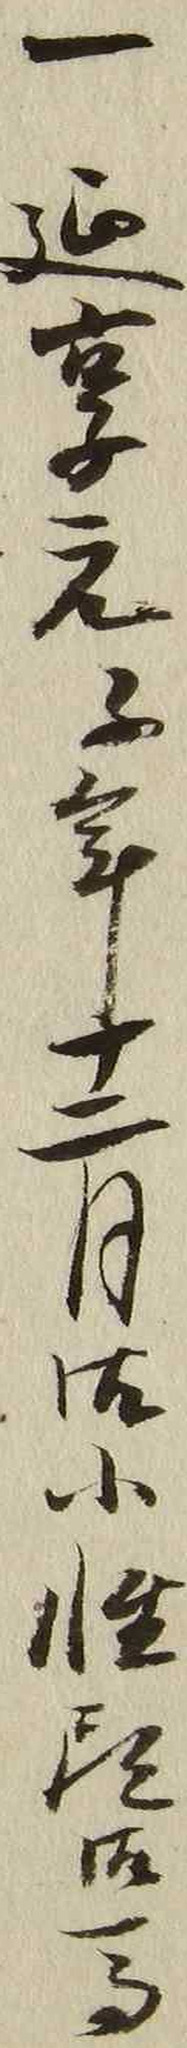一延享元子年十二月御小性頭御馬
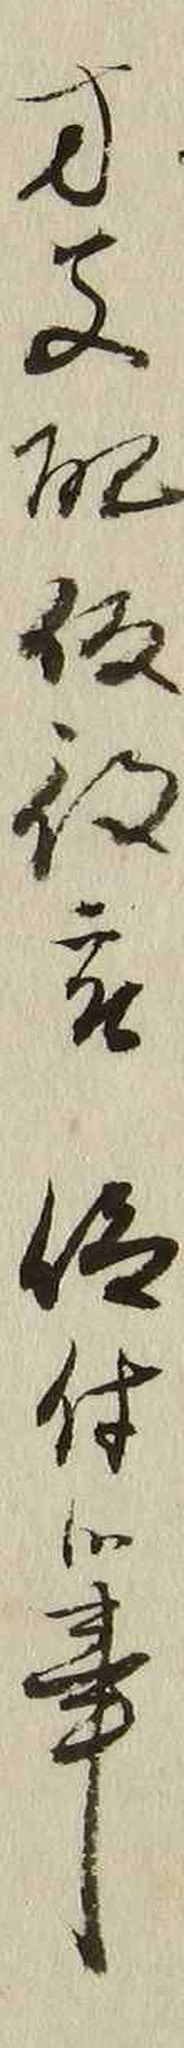方支配仮役被仰付候事
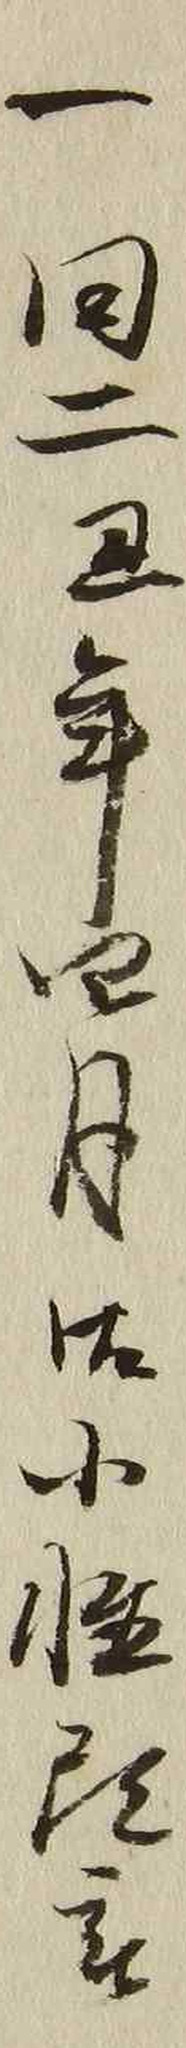一同二丑年四月御小性頭被
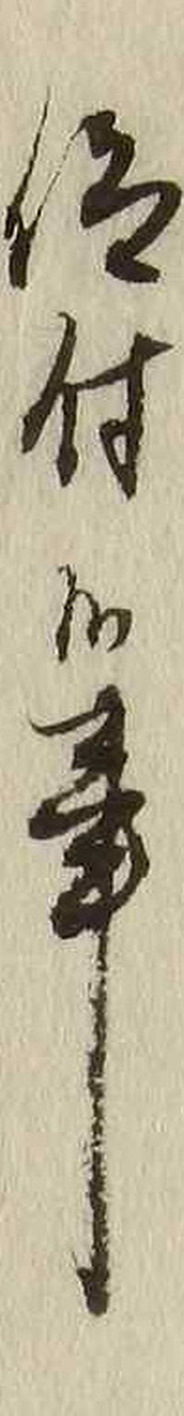仰付候事
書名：諸士系譜　巻之348　も之部4
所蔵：会津若松市立会津図書館
